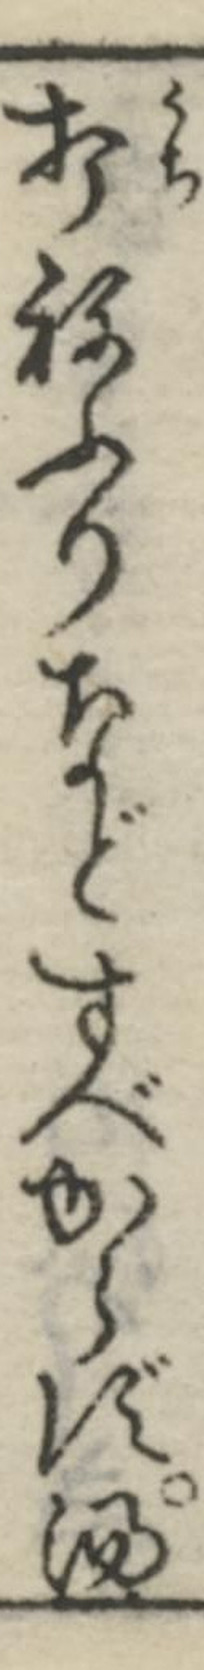打ねふりなどすべからず。湯
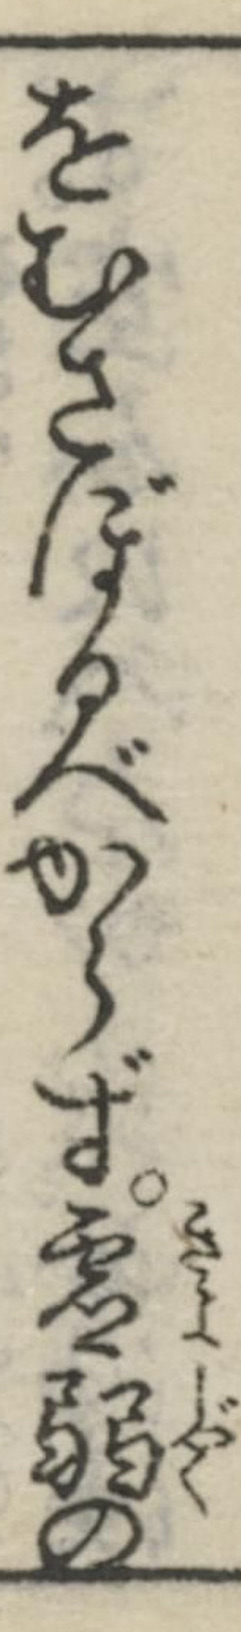をむさぼるべからず。虚弱の
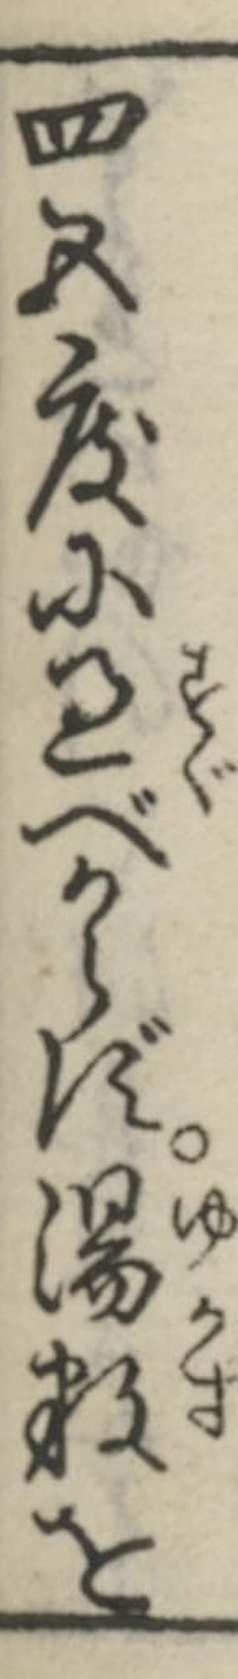四五度に過べからず。湯数を
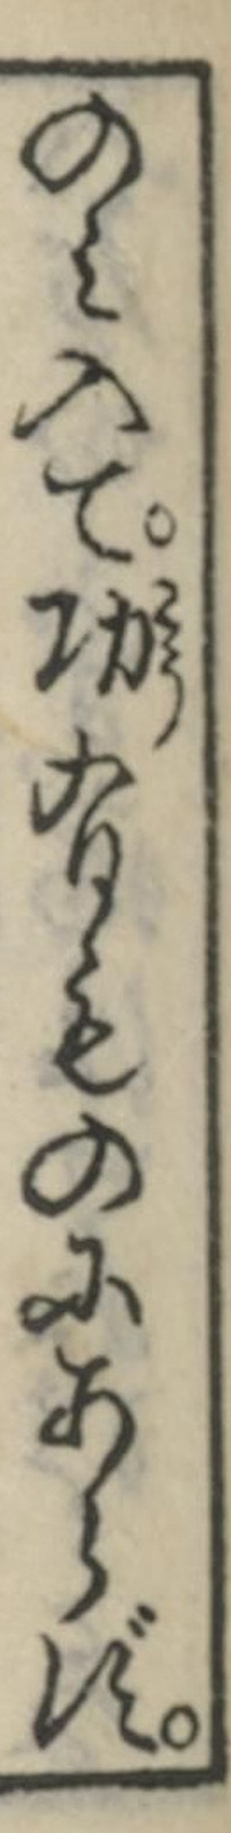のみ入りて。功有ものにあらず。
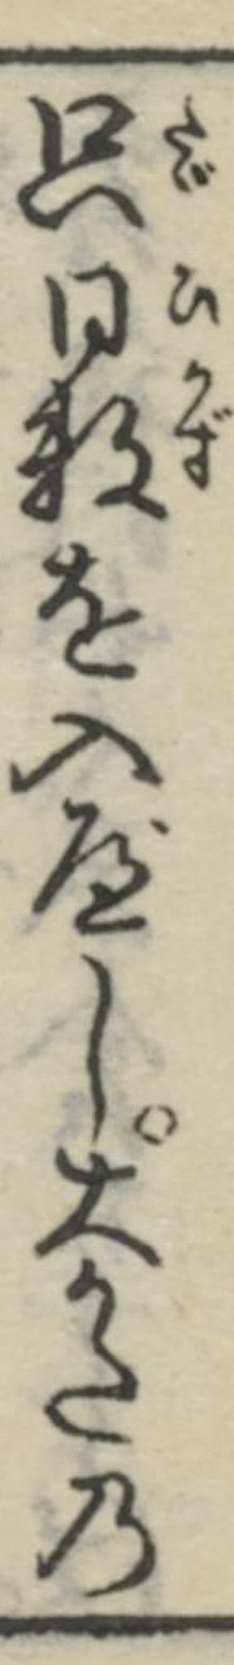只日数を入べし。大かたの
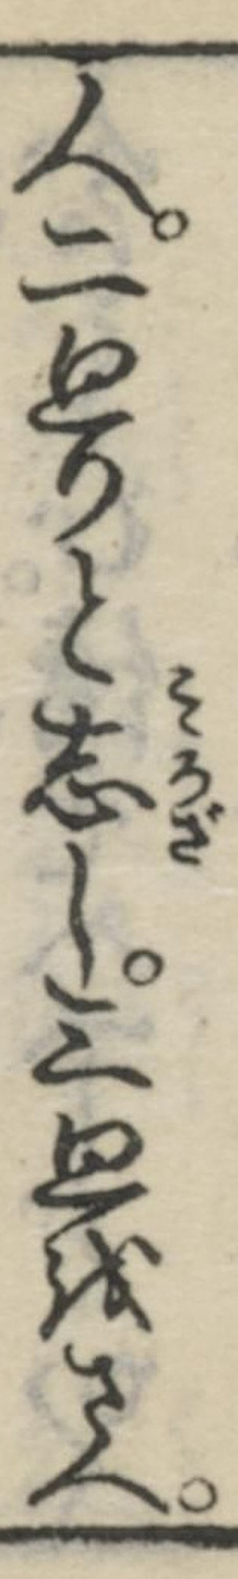人二廻りと志し。三廻をさへ。
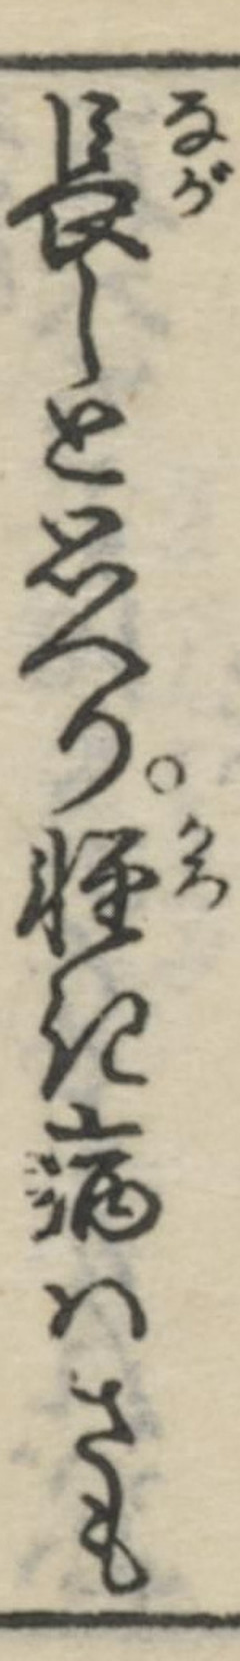長しと思へり。軽き病はさも
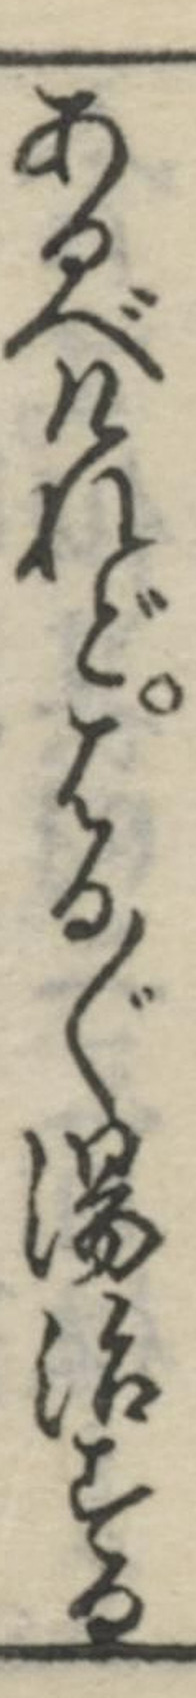あるべけれど。はる〴〵湯治する
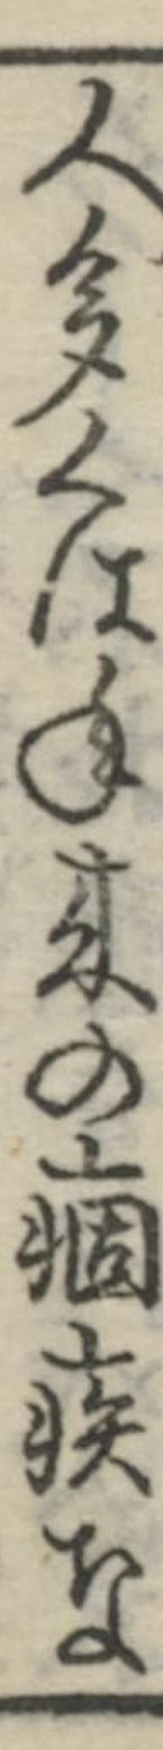人。多くは本来の痼疾な
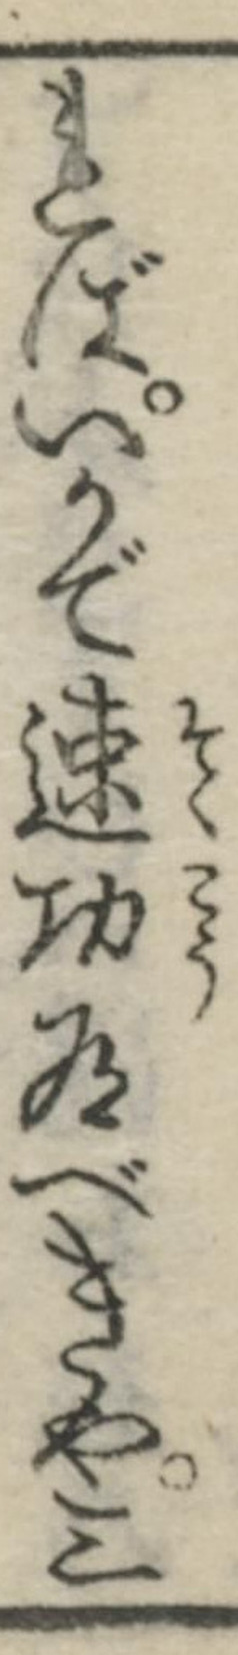れば。いかで速功有べきや。三
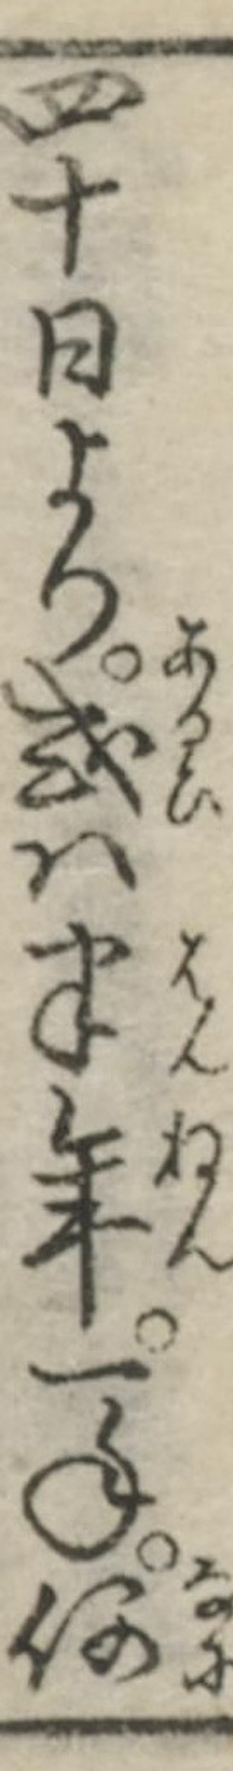四十日より。或は半年。一年。何
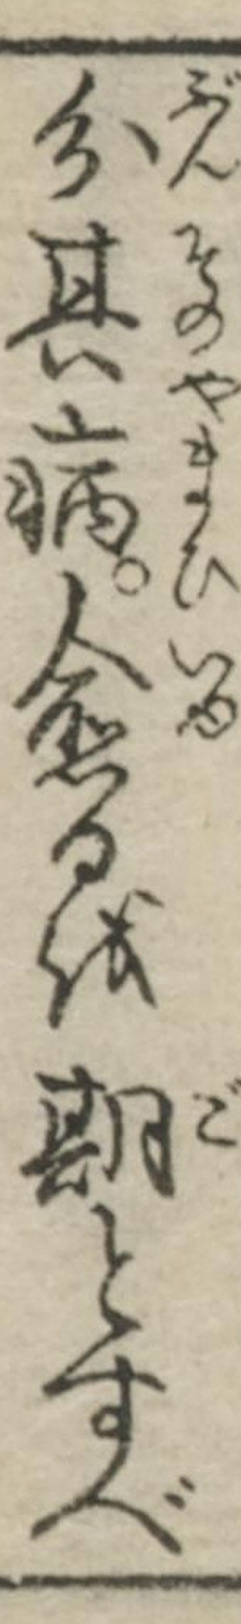分其病。癒るを期とすべ
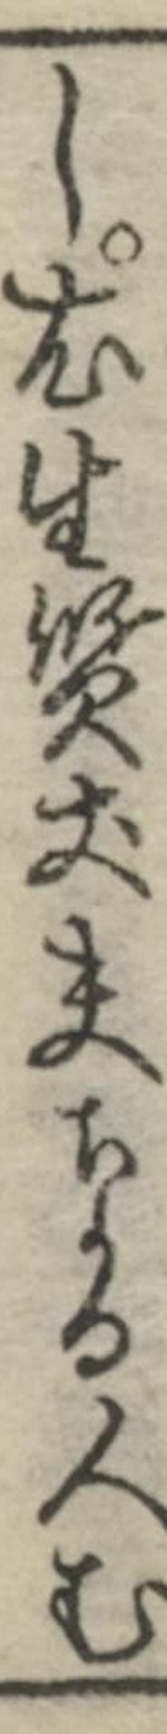し。尤生質丈夫なる人。む
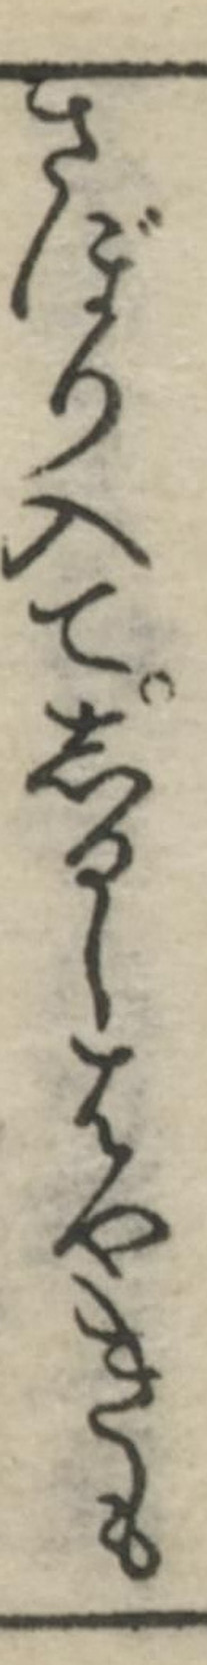さぼり入て。しるしはやきも
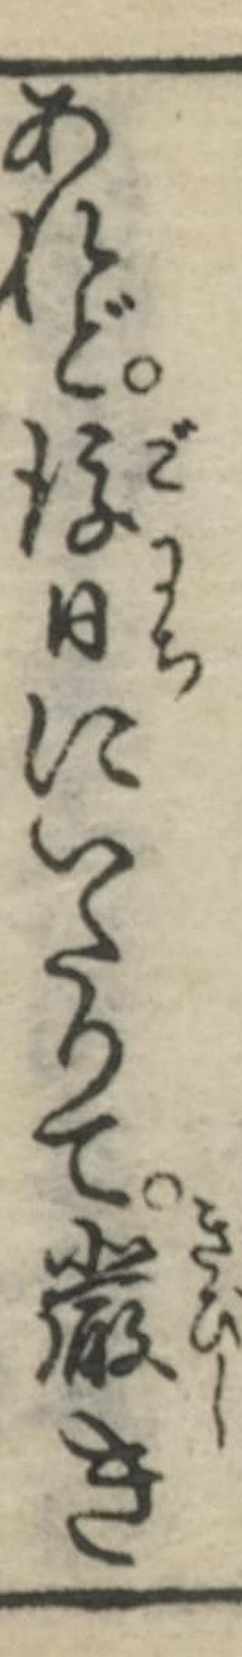あれど。後日にいたりて。厳き

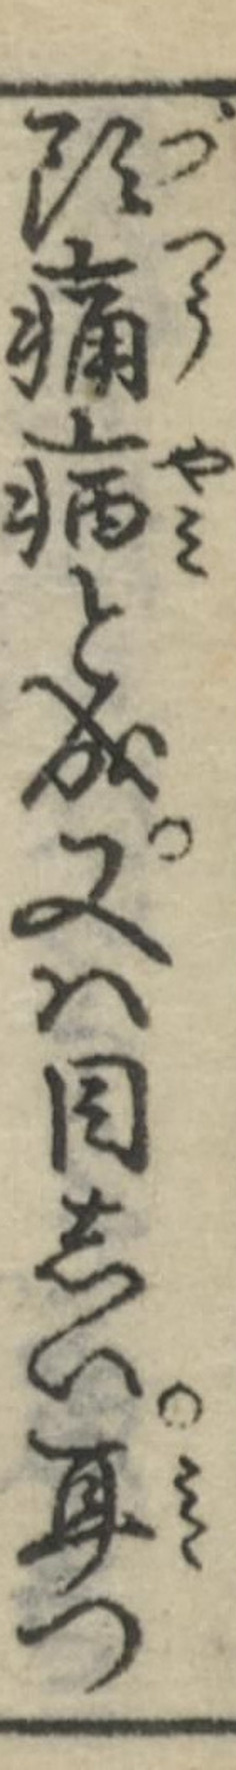頭痛病と成。又は目しい。耳つ
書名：但州城崎浴湯辧
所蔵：東京大学地震研究所図書室 Earthquake Research Institute Library, The University of Tokyo, JAPAN
